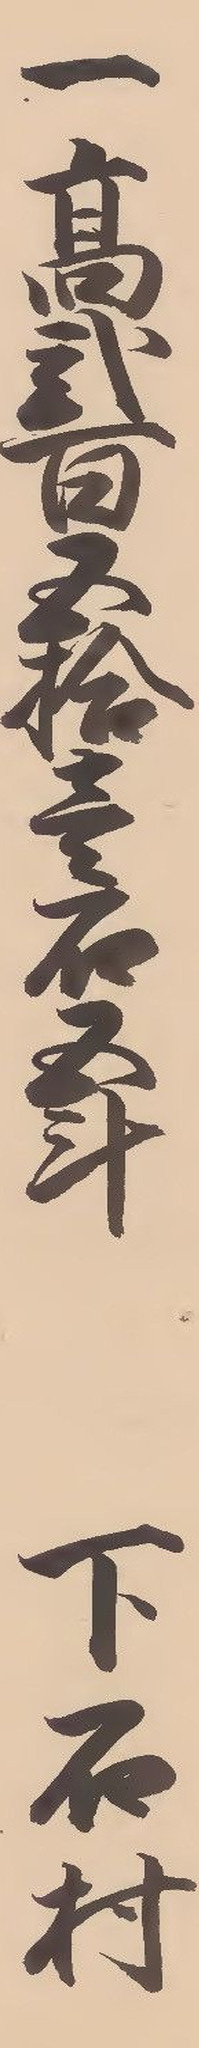一高弐百五拾壱石五斗下石村
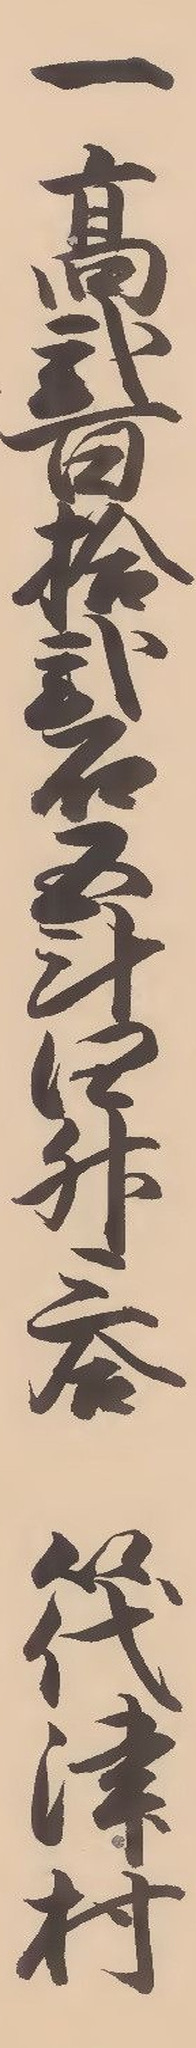一高弐百拾弐石五斗四升三合筏津村
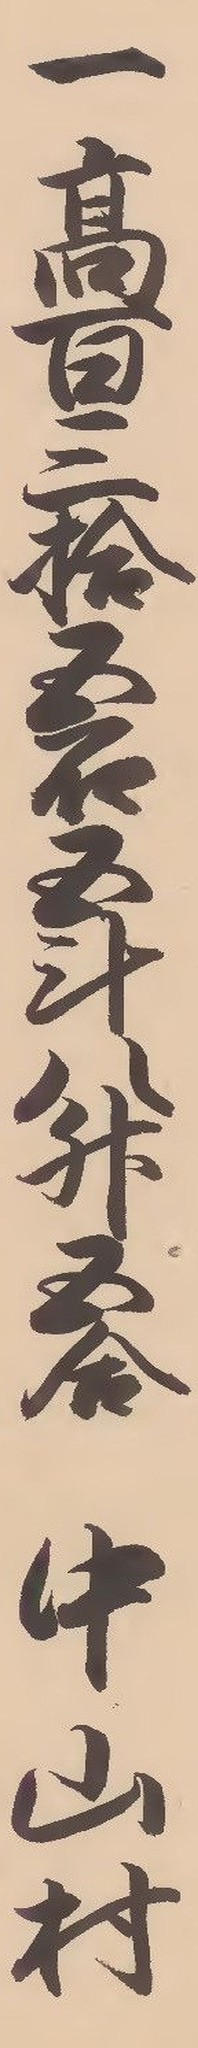一高百三拾五石五斗八升五合中山村

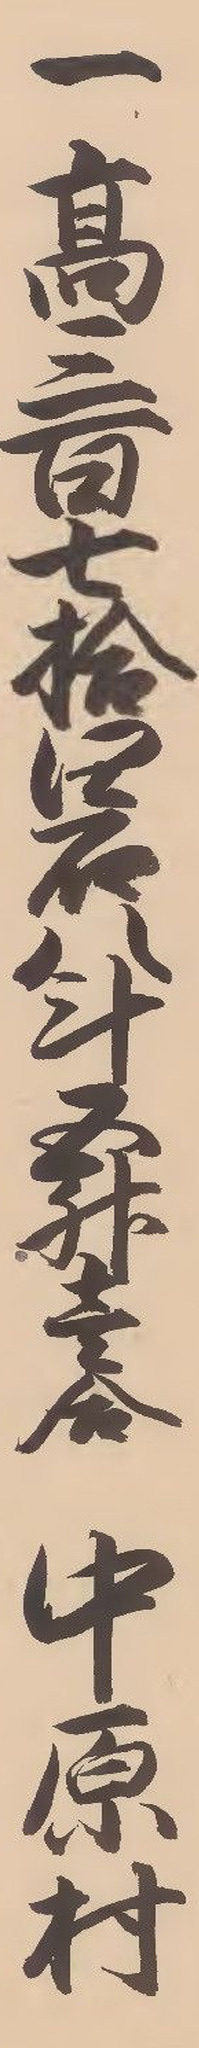一高三百七拾四石八斗五升壱合中原村
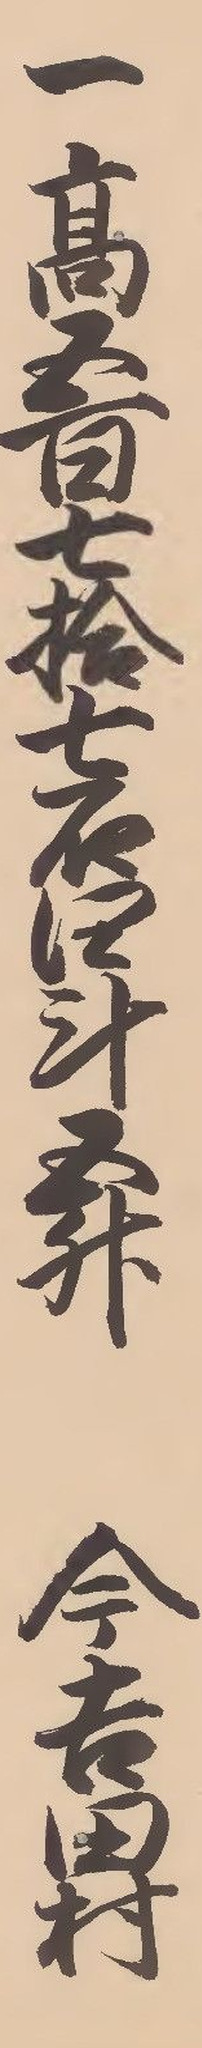一高五百七拾七石四斗五升今吉田村
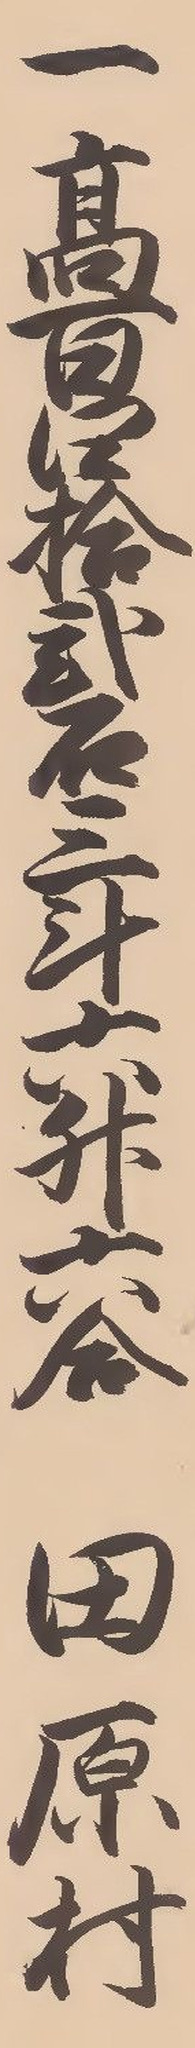一高百四拾弐石三斗六升六合田原村
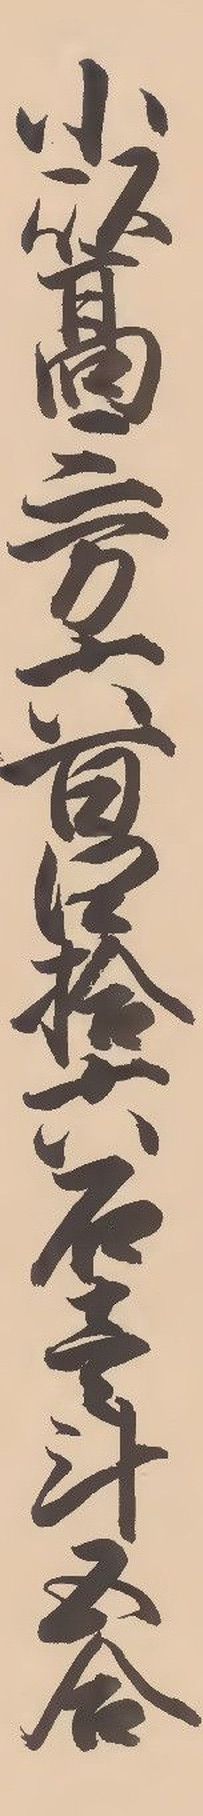小以高三万六百四拾六石壱斗五合

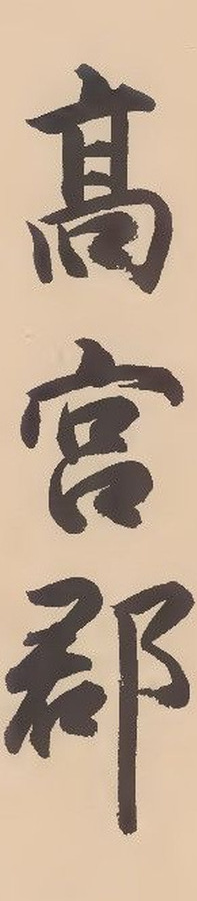高宮郡
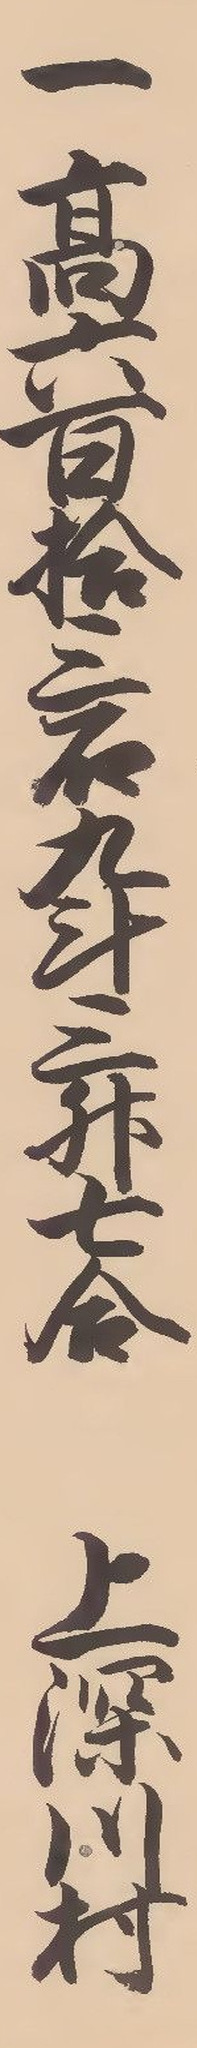一高六百拾三石九斗三升七合上深川村
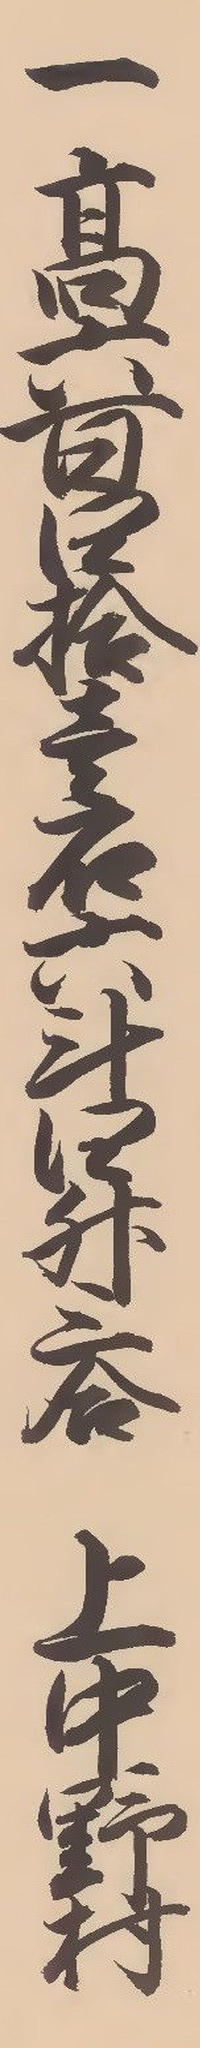一高六百四拾壱石六斗四升三合上中野村
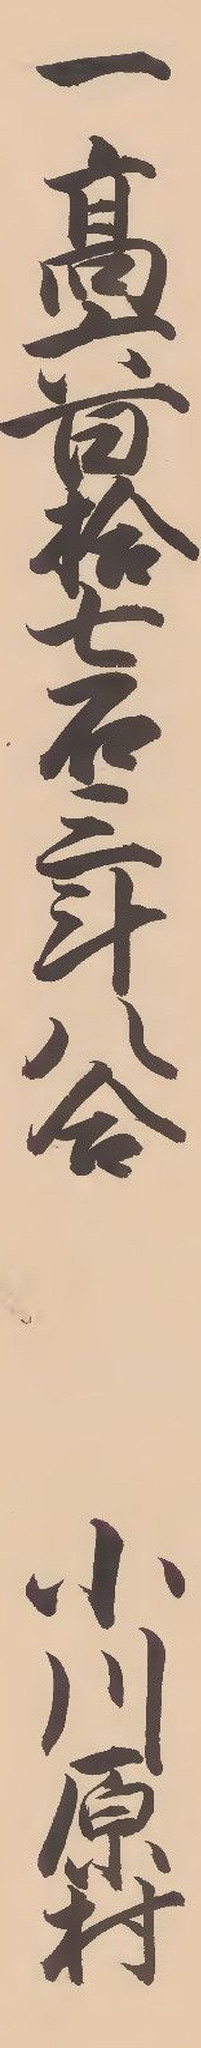一高六百拾七石三斗八合小川原村
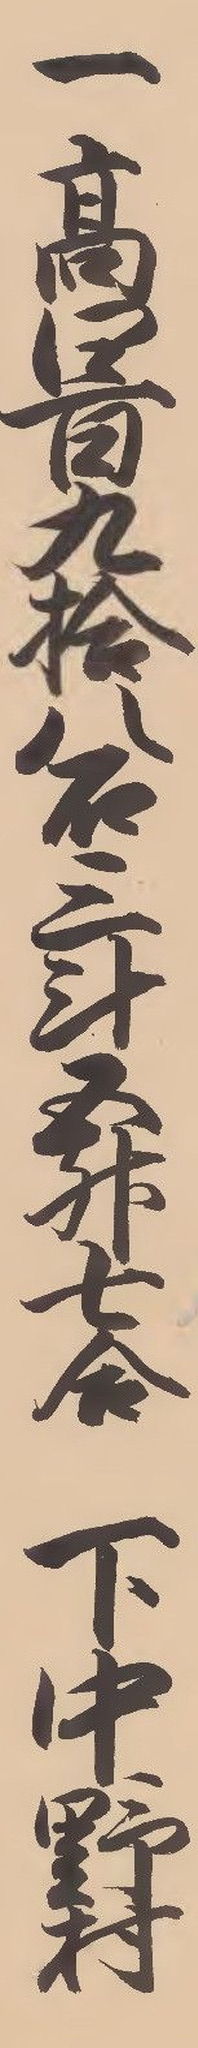一高四百九拾八石三斗五升七合下中野村
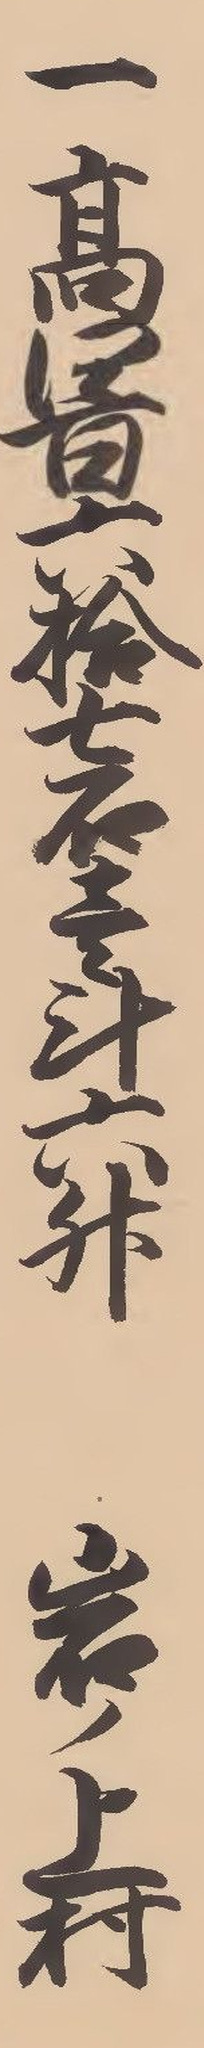一高四百六拾七石壱斗六升岩ノ上村
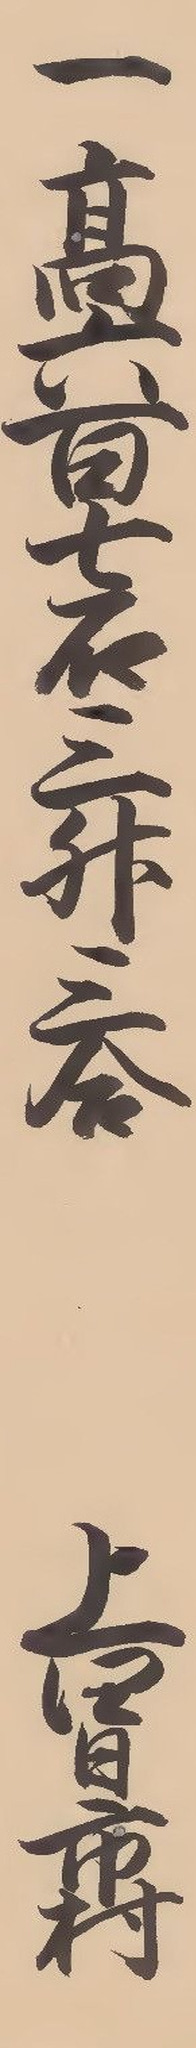一高六百七石三升三合上四日市村
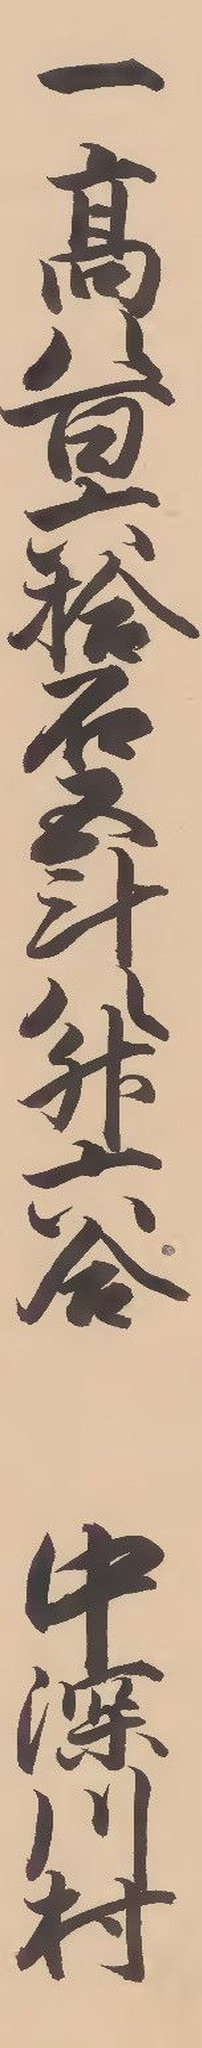一高八百六拾石五斗八升六合中深川村

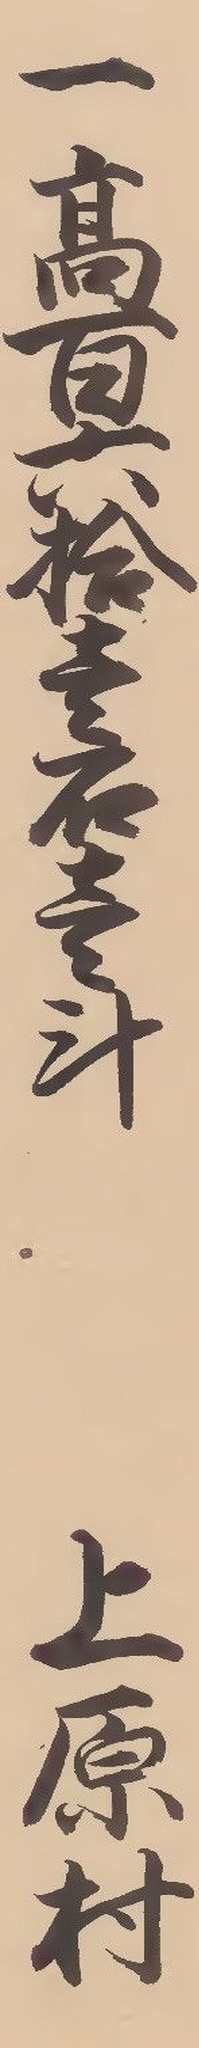一高百六拾壱石壱斗上原村
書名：安芸国郷帳
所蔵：国立公文書館 National Archives of Japan
